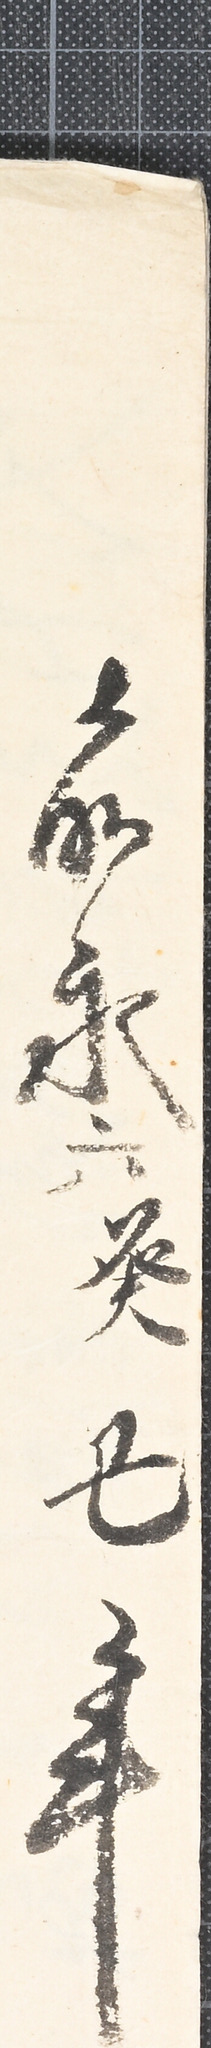嘉永癸丑年
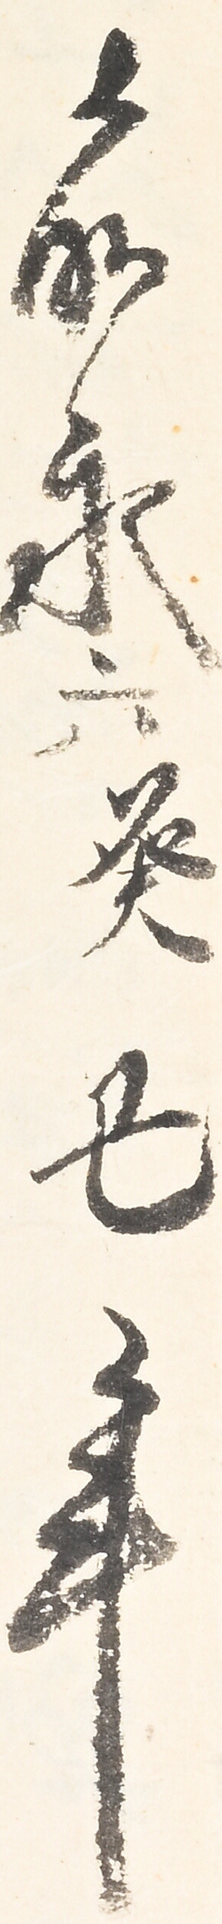嘉永癸丑年
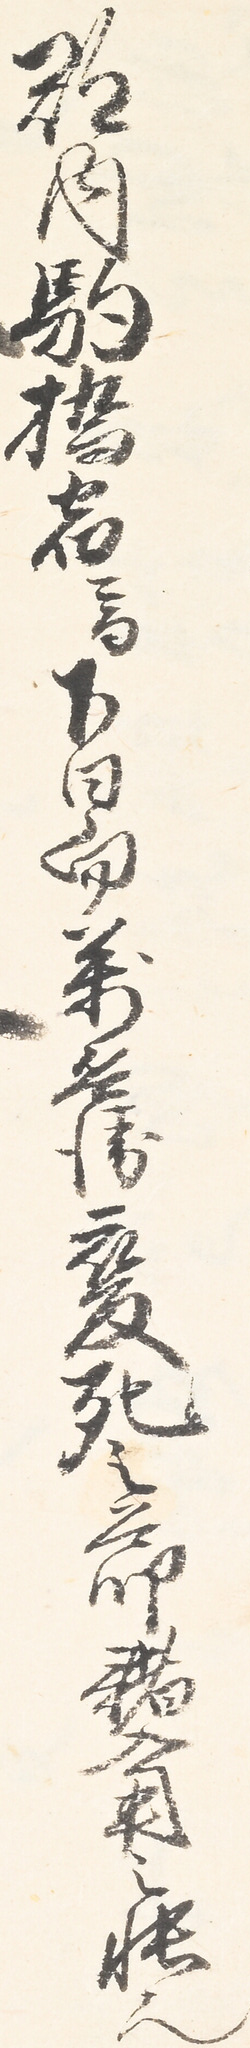郡内駒橋宿ニ而下日向万兵衛変死之節諸入用之帳也
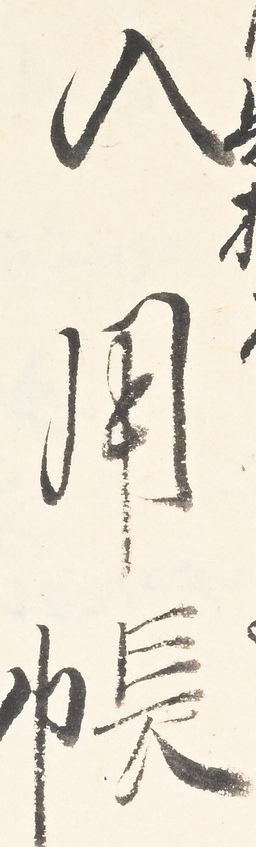入用帳
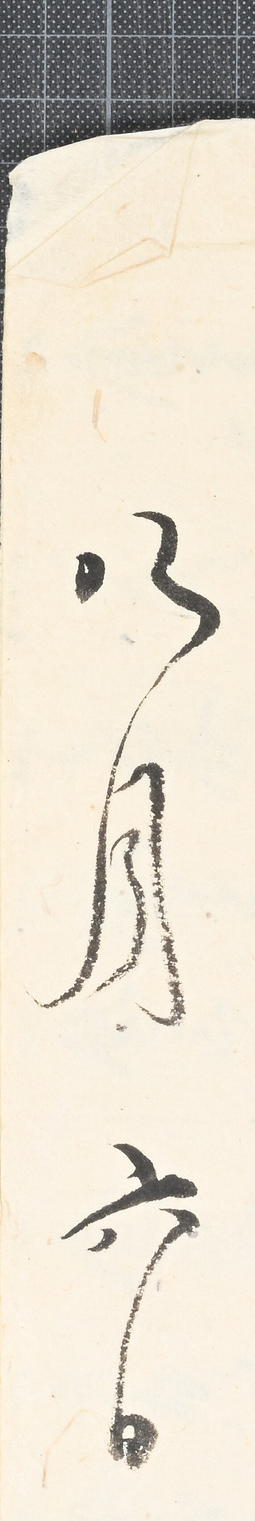八月六日
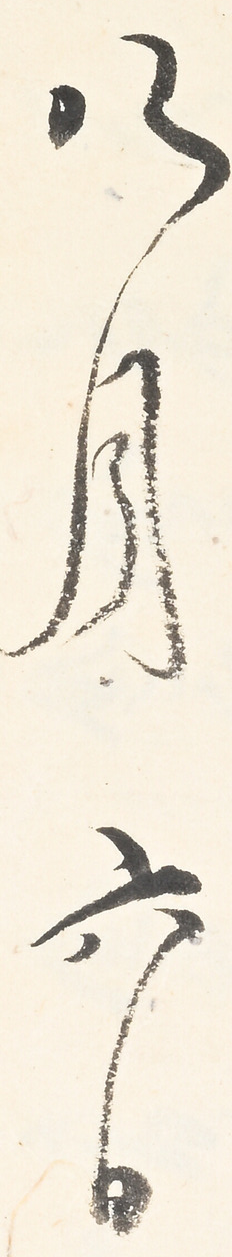八月六日
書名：嘉永六癸丑年八月六日入用帳
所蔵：伊那市立高遠町図書館・合同会社AMANE
